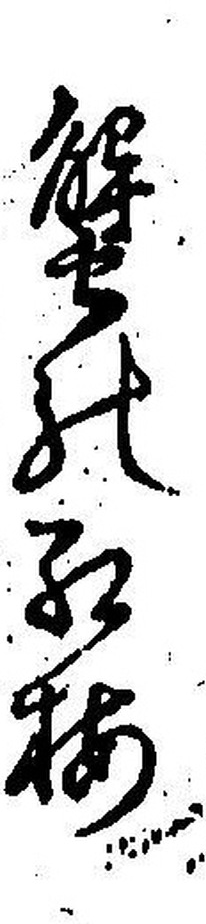蟹の紅梅

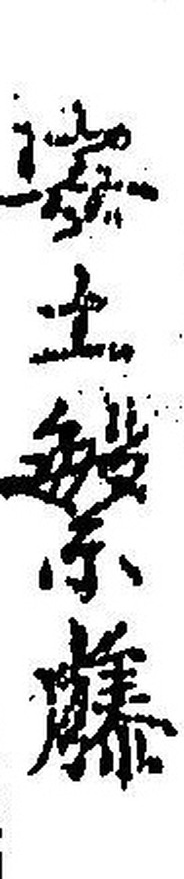安土繁藤
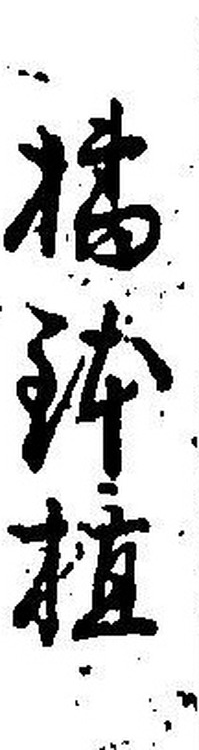楠鉢植
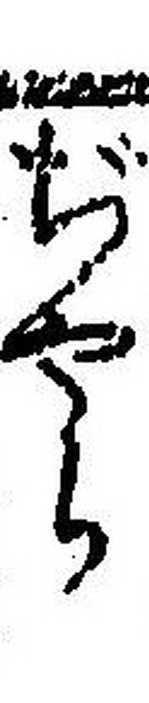ぢやら
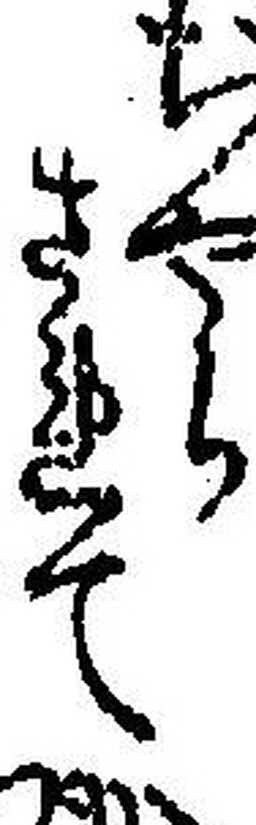されて
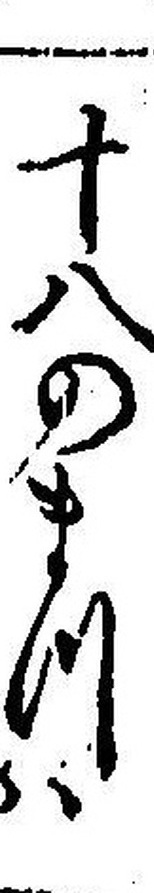十八のまつは
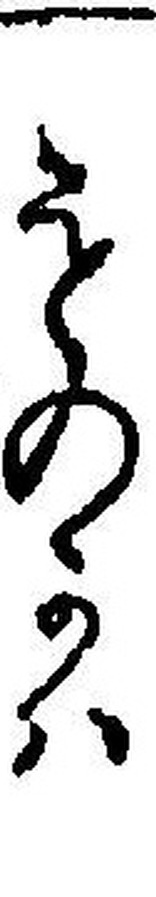そのかは
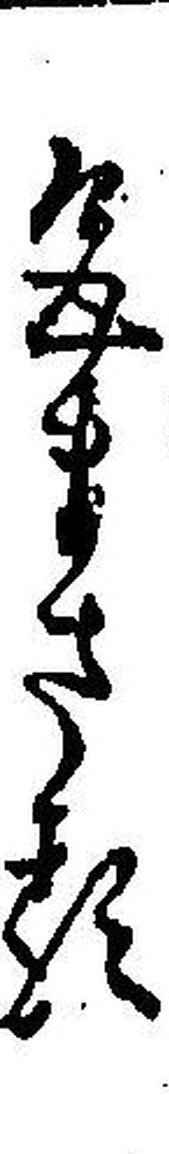色まさる
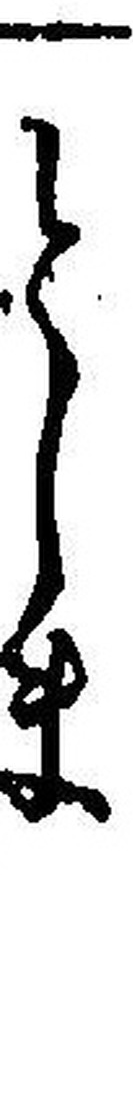としま
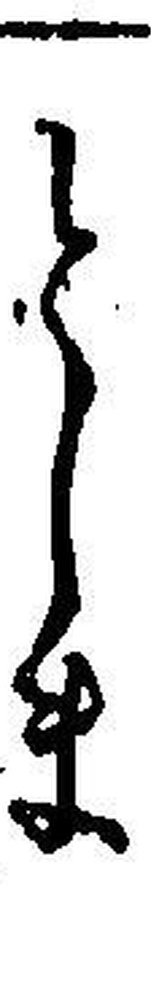としま
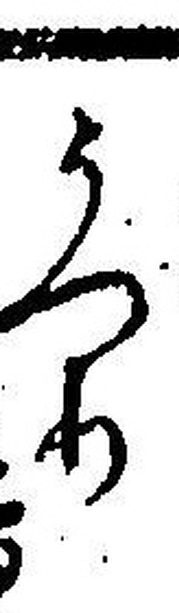うつり
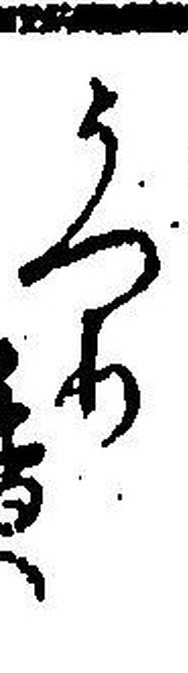うつり
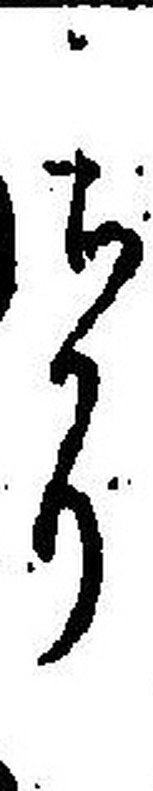さかり
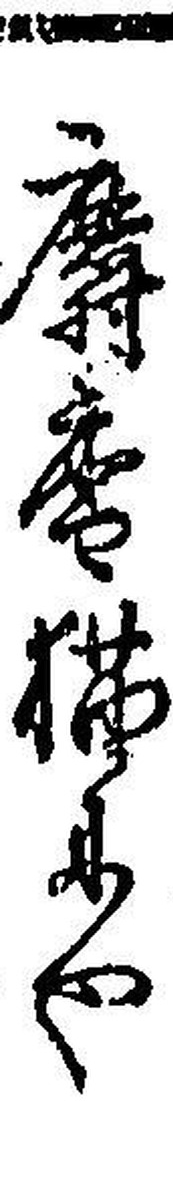麝香猫にや
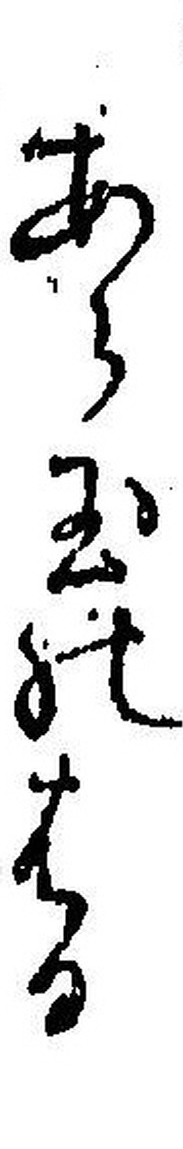あら玉のはる
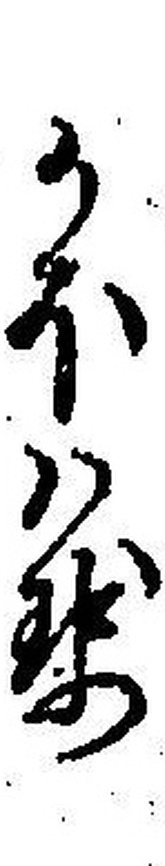かほはせ
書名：どうれ百人一首 / 鹿都部真顔(狂歌堂)編
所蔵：東京大学総合図書館 General Library in the University of Tokyo, JAPAN
